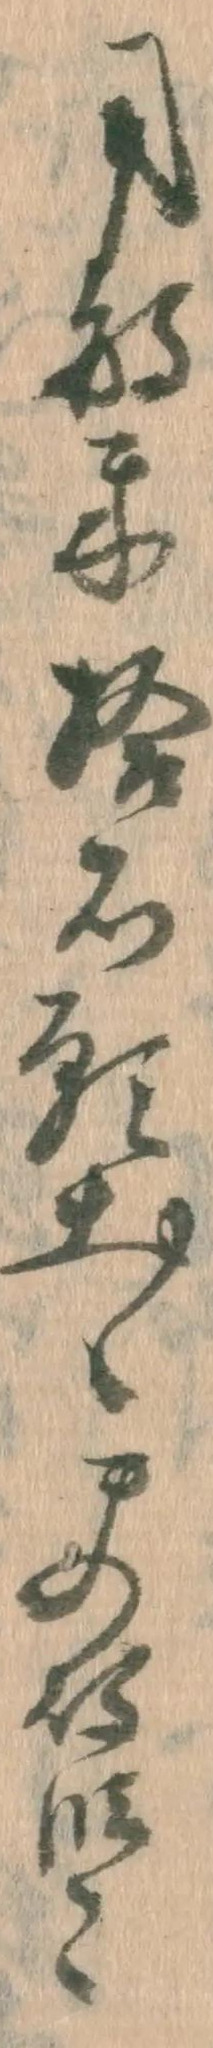用赦米拾石願出候夫故段々
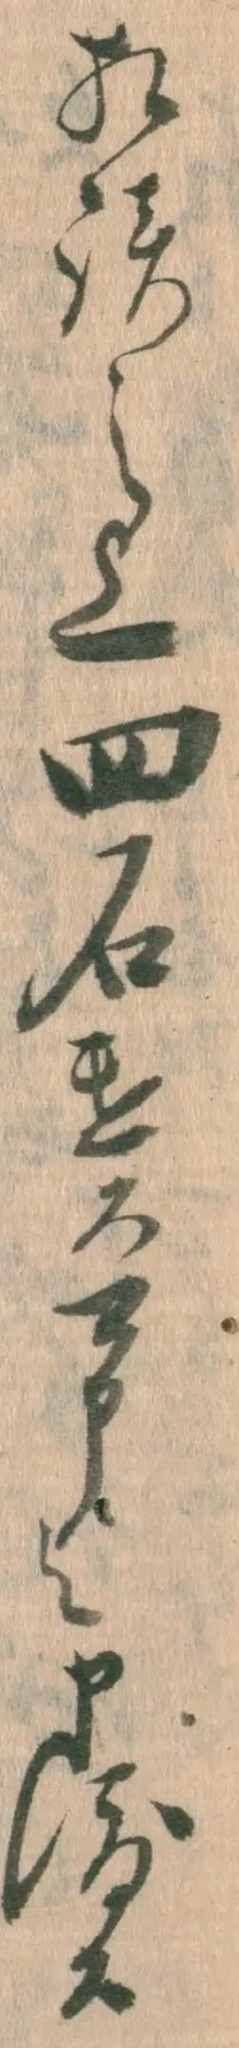相談之上四石遣ス可申与申渡ス
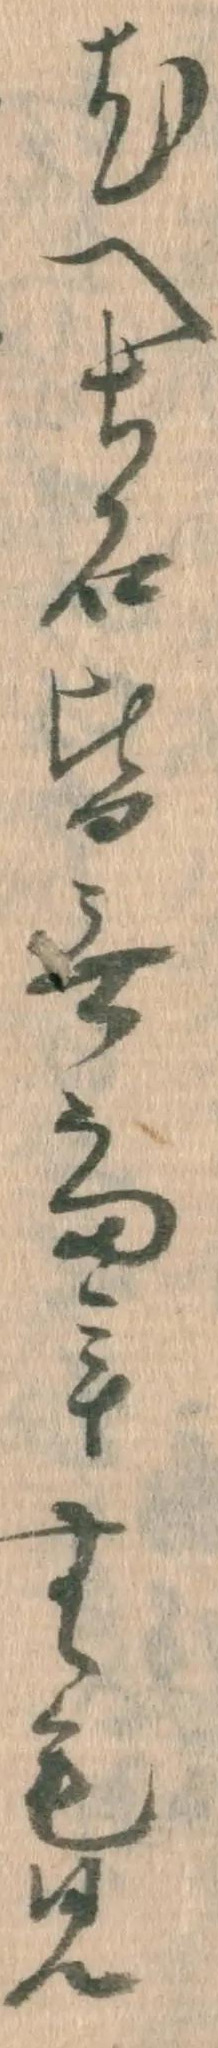尤へち石皆無当年無毛見
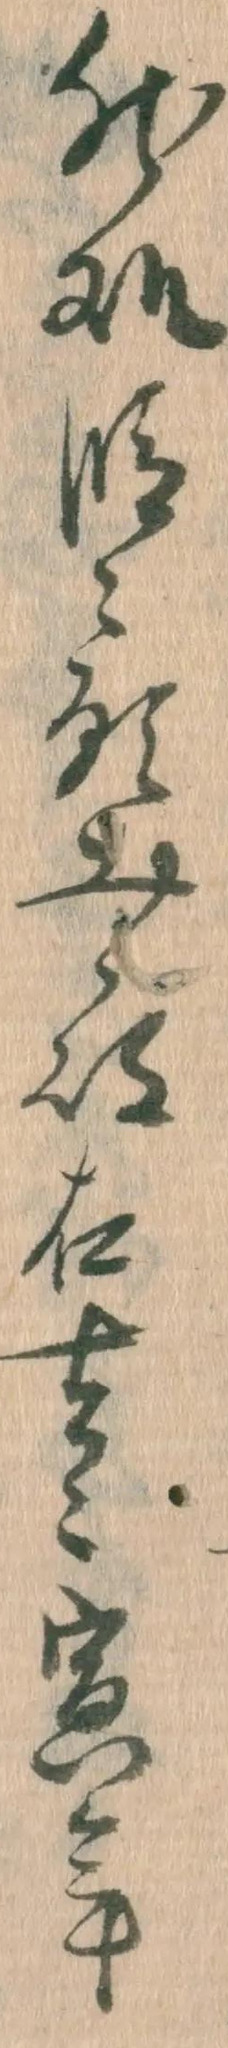然処段々願出候故右去々寅年
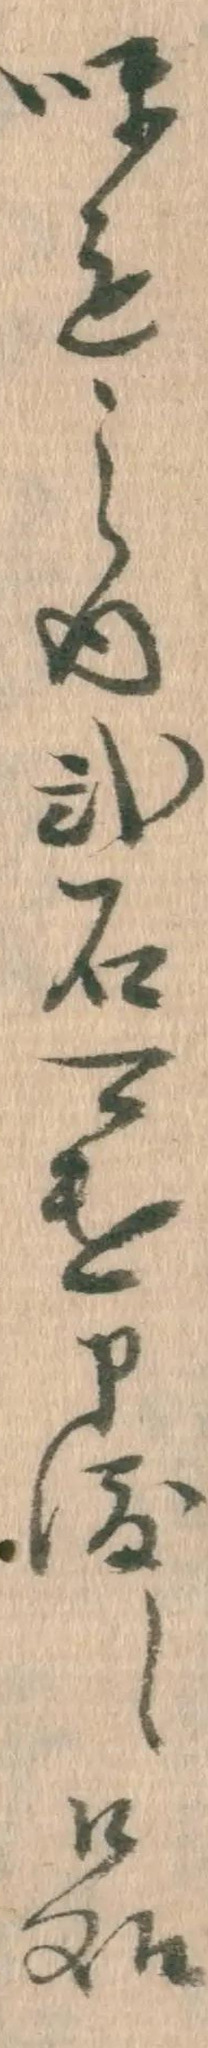味進之内弐石可遣申渡し候処
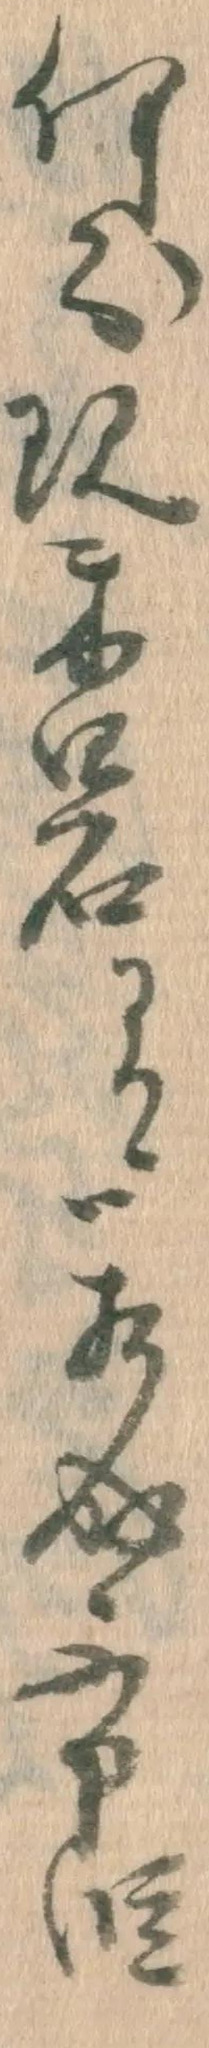何分現米四石にてハ相成不申段
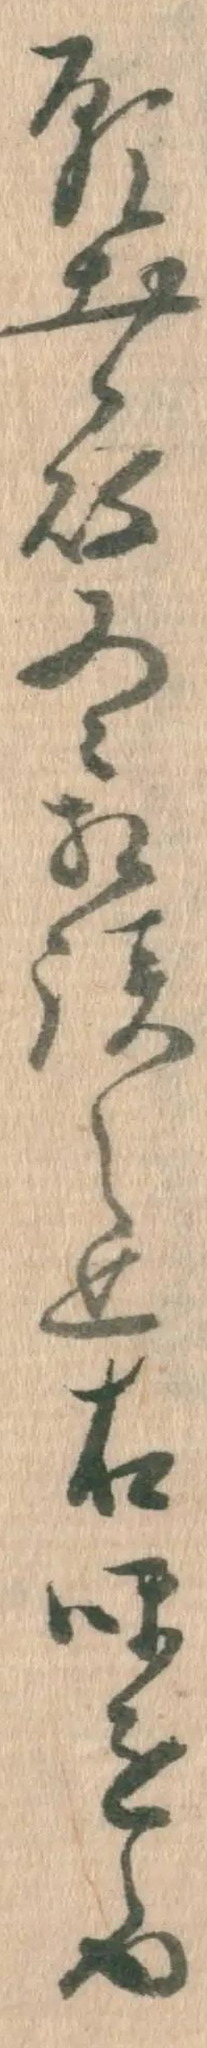願出候故又々相談之上右味進之内
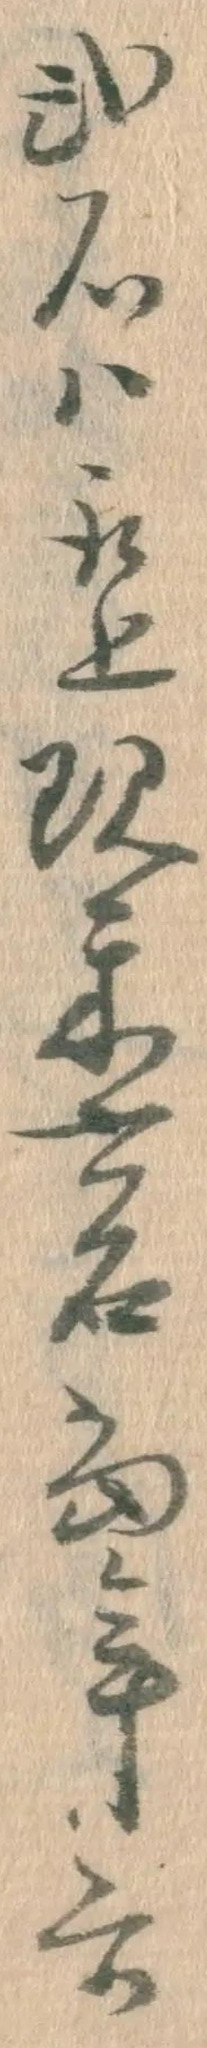弐石ハ取上現米六石当年
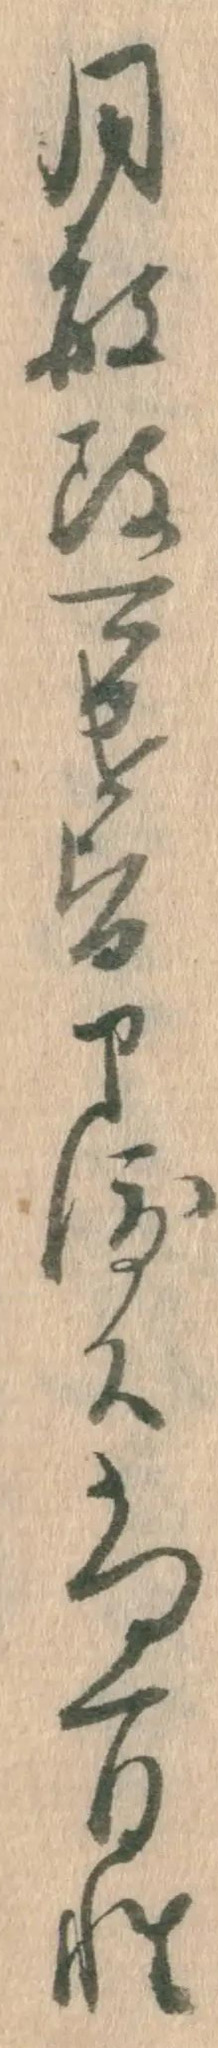用赦改可遣旨申渡ス尚百性
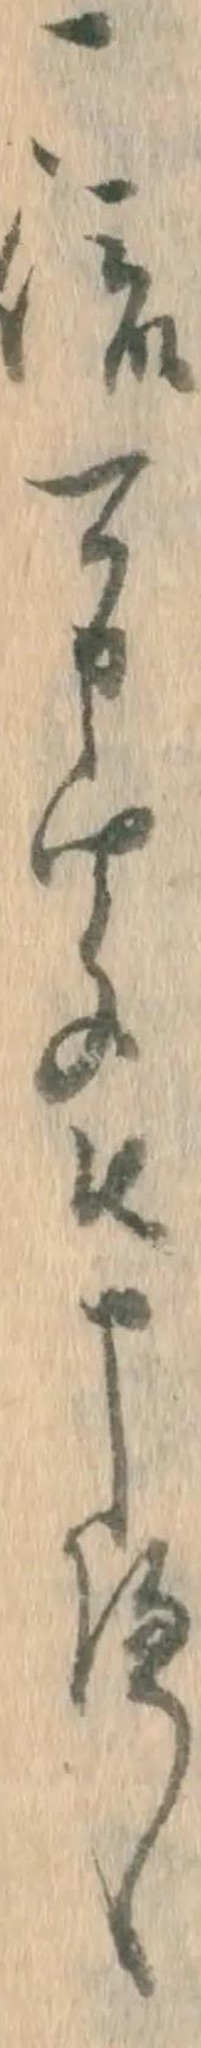一統可申聞被申渡候

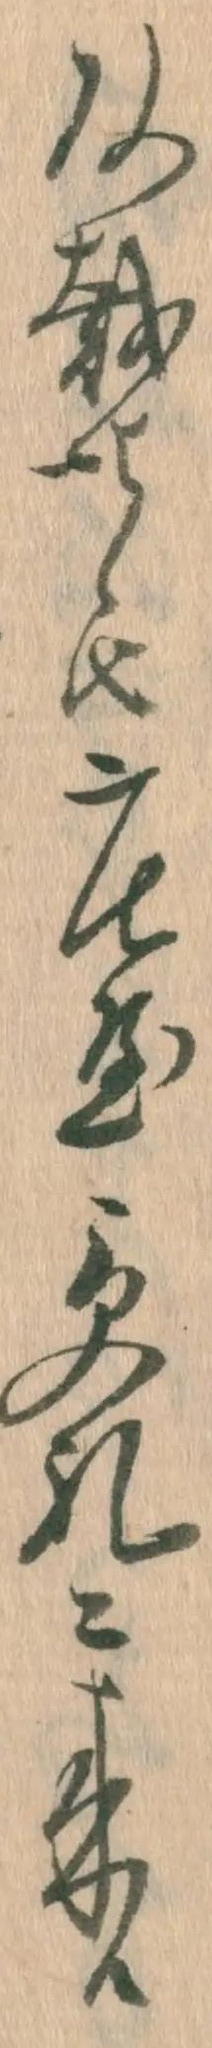頂戴仕候由庄屋受礼ニ来ル
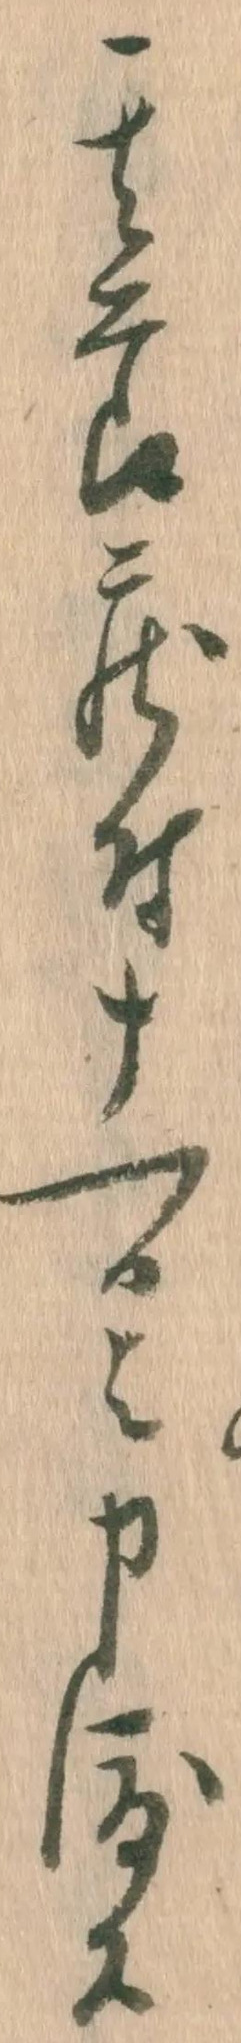其節蔵付十一日与申渡ス
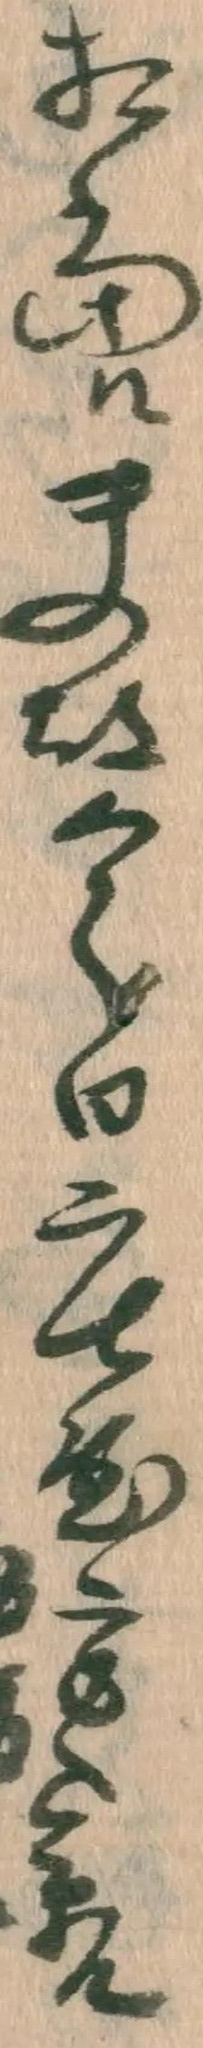相当ル夫故今日庄屋方へ参ル
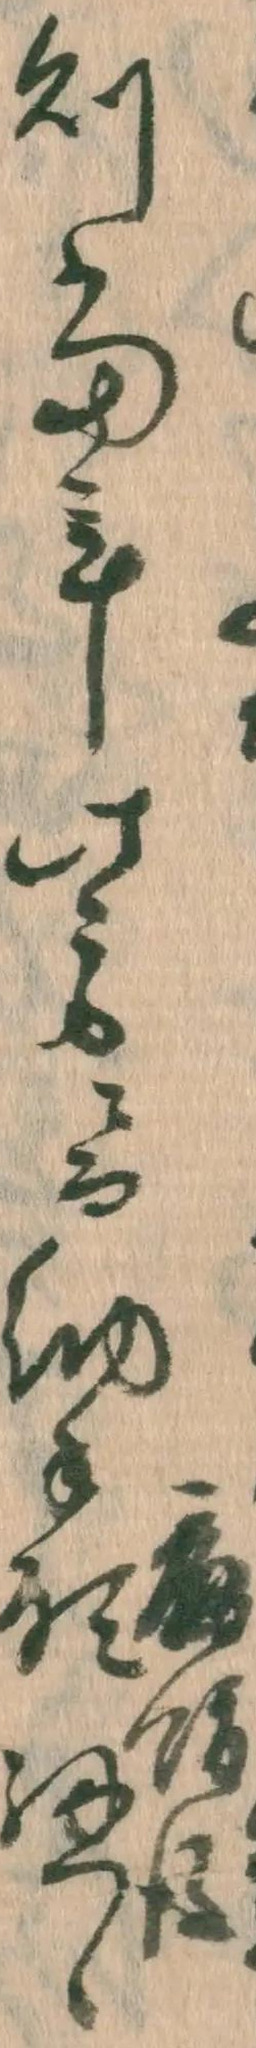則当年此方ニ而納手形認候
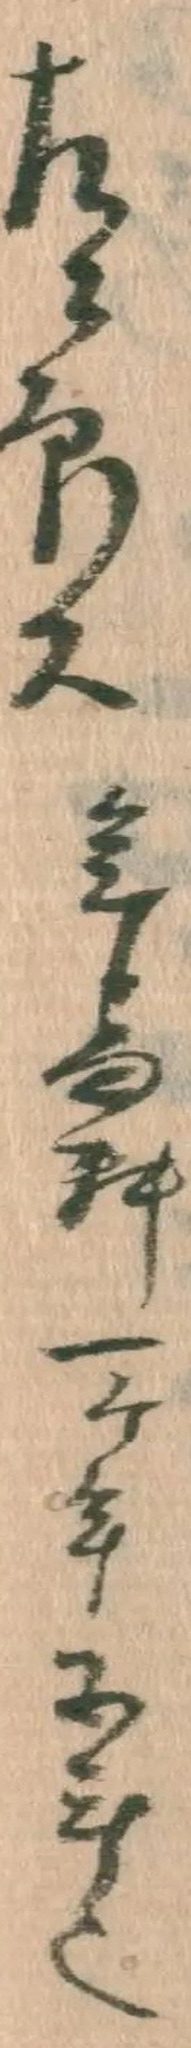左ニ印ス年番料一ケ年五斗也
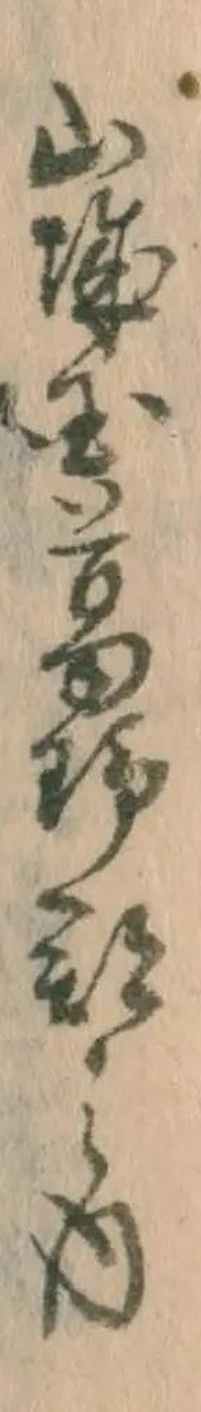覚山城国葛野郡之内
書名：賀茂社記録. 第61冊
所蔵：国立国会図書館 National Diet Library, JAPAN
